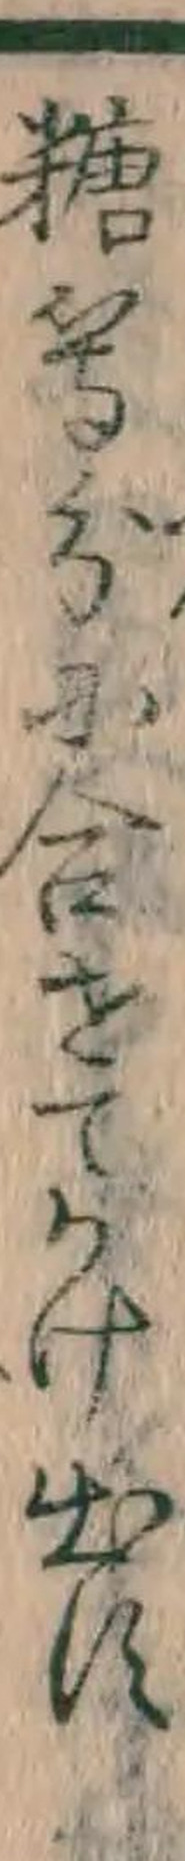糖等分に合せてかけ出す
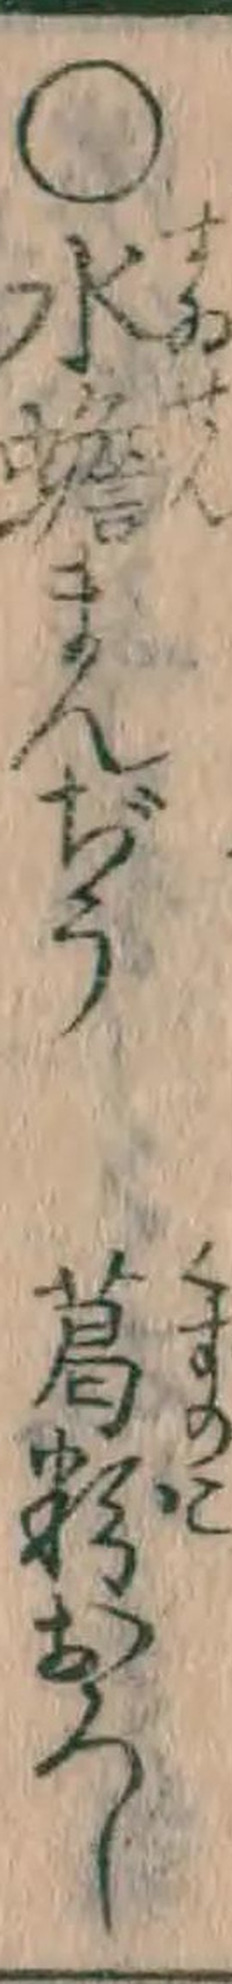○水蟾まんぢう葛粉おろし
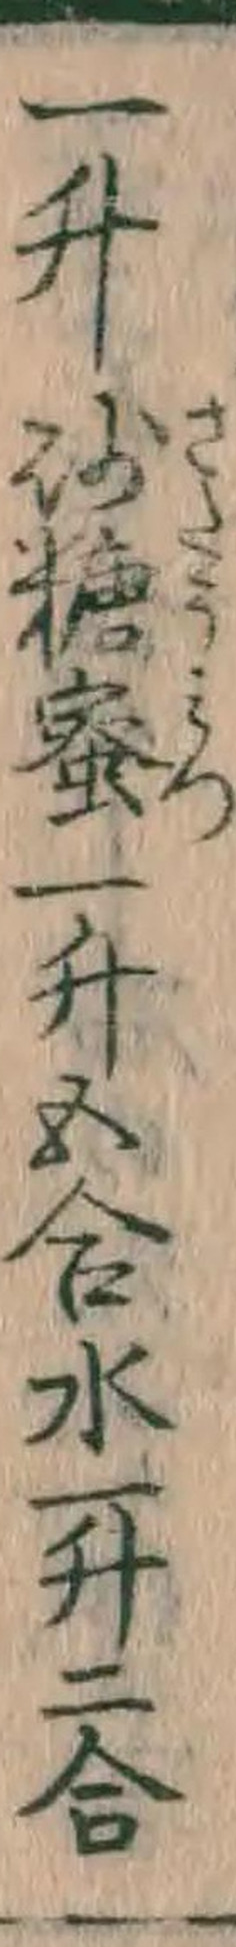一升砂糖蜜一升五合水一升二合
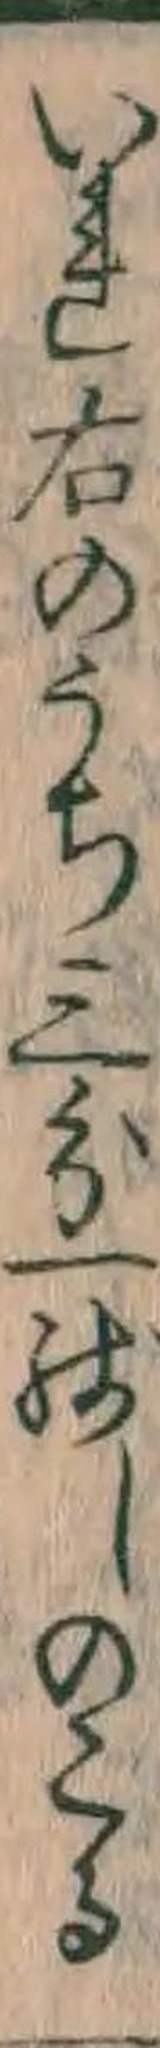いれ右のうち三分一残しのこる
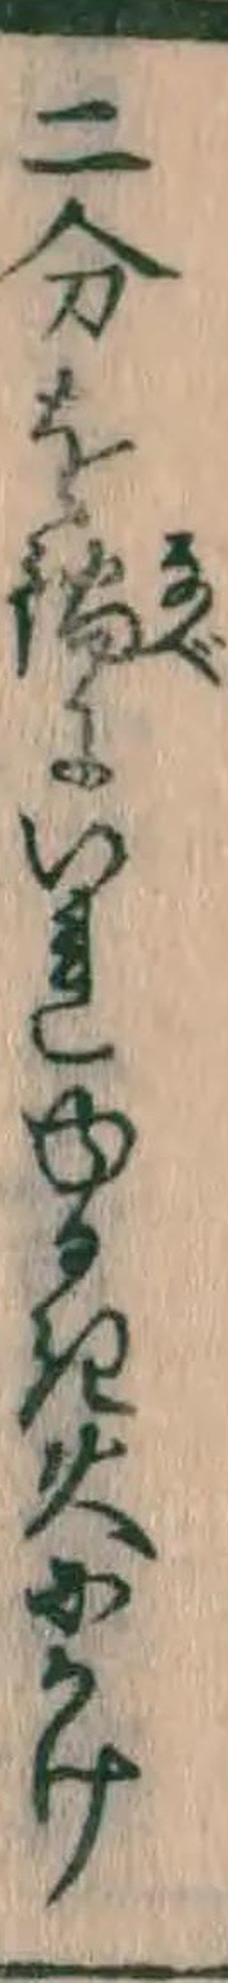二分を鍋にいれゆるき火にかけ
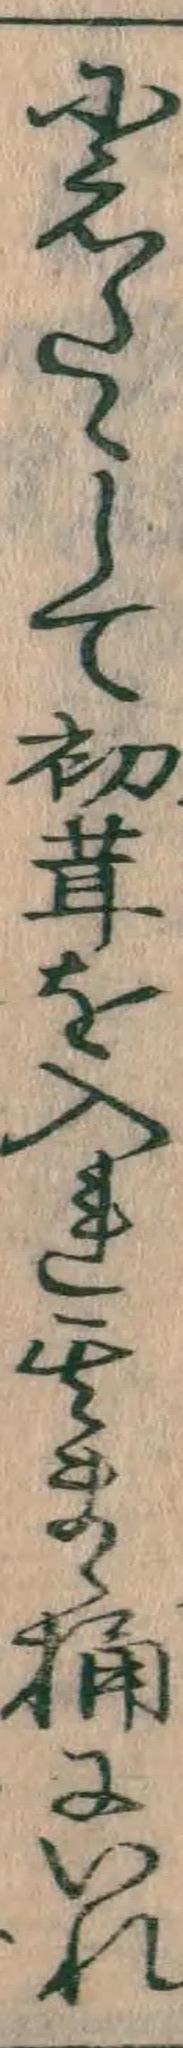にえたゝして初茸を入れ其まゝ桶にいれ
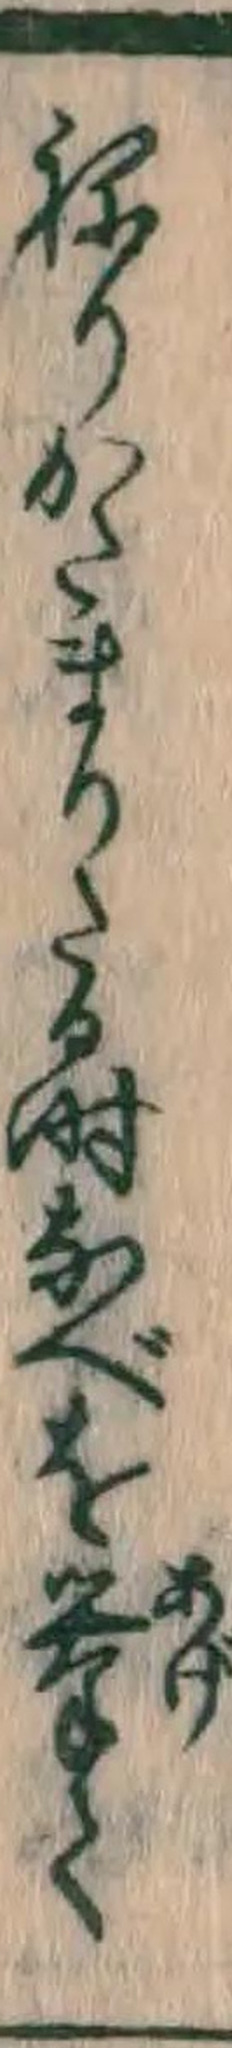ねりかたまりたる時なべを挙て
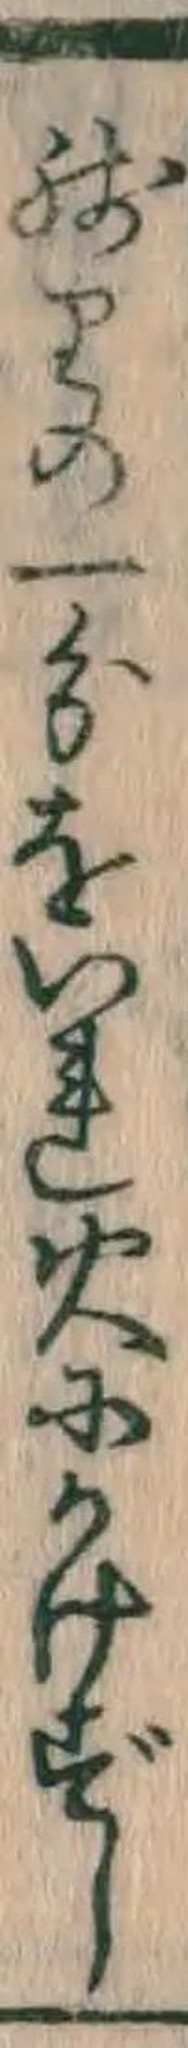残りの一分をいれ火にかけずし
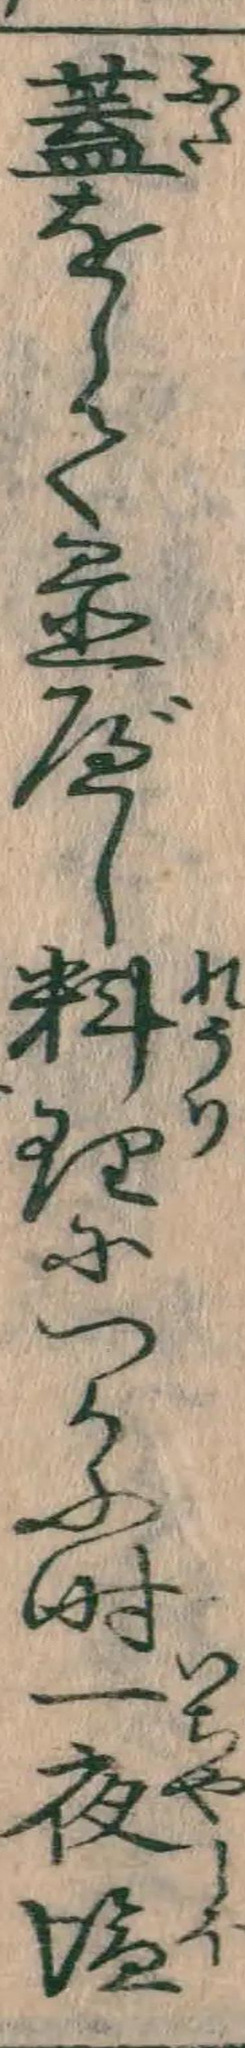蓋をして置べし料理につかふ時一夜塩
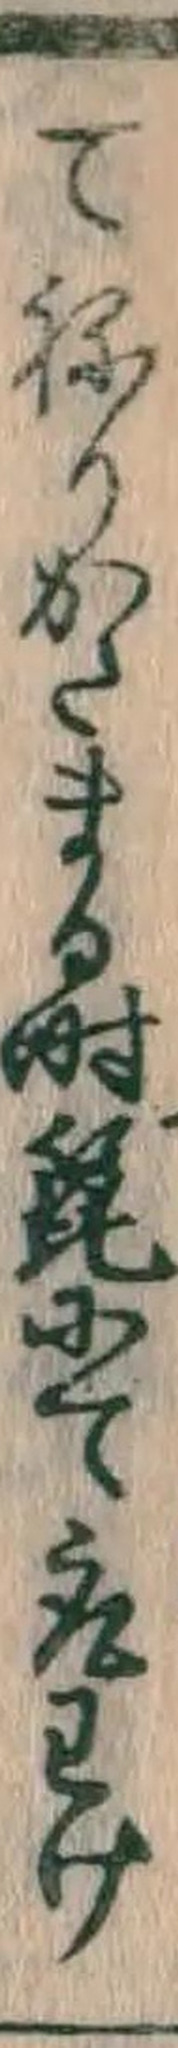てねりかたまる時箆にて取わけ
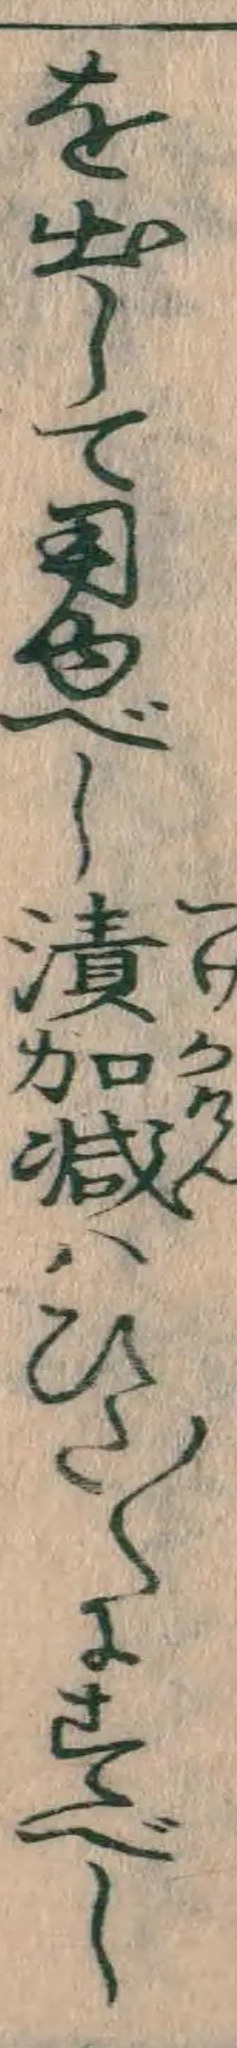を出して用ゆべし漬加減はひた〳〵にすべし
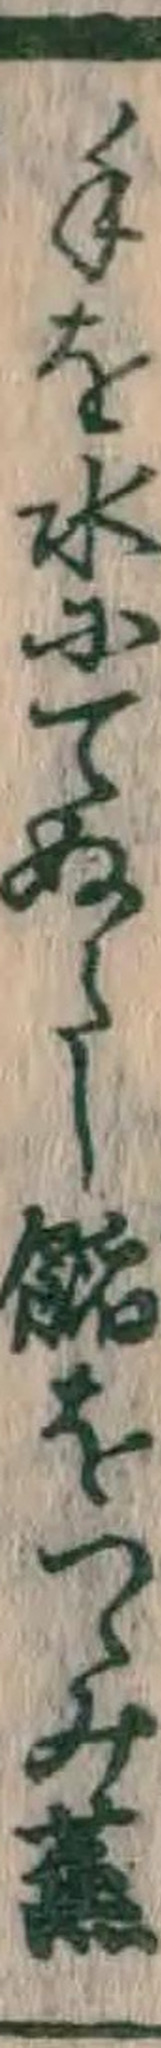手を水にてぬらし餡をつゝみ蒸
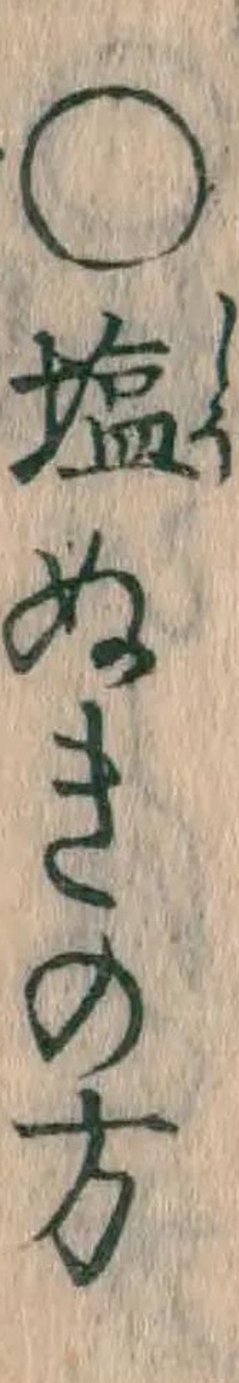○塩ぬきの方
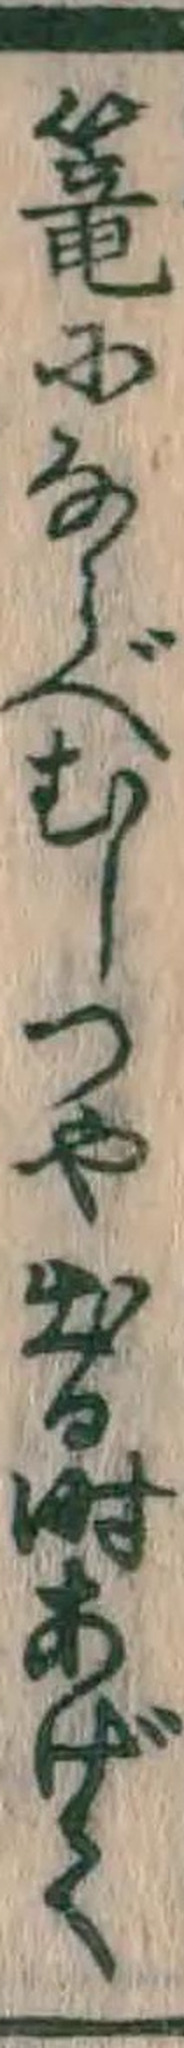篭にならべむしつや出る時あげて
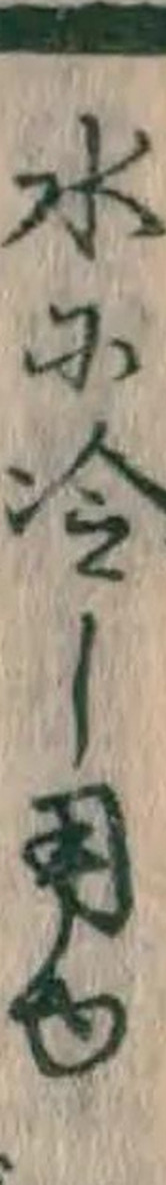水に冷し用ゆ
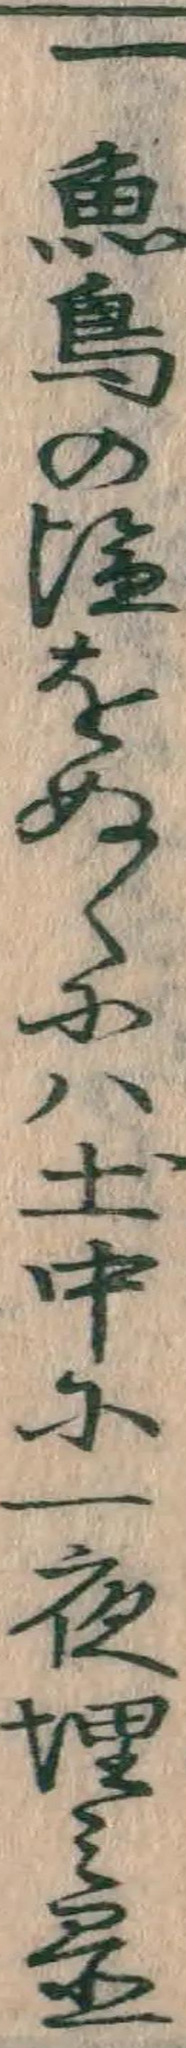一魚鳥の塩をぬくには土中に一夜埋み置
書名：広益秘事大全 3巻. [5]
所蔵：国立国会図書館 National Diet Library, JAPAN
